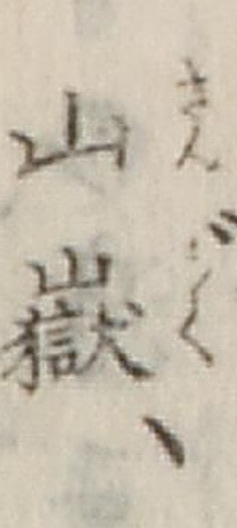山嶽、
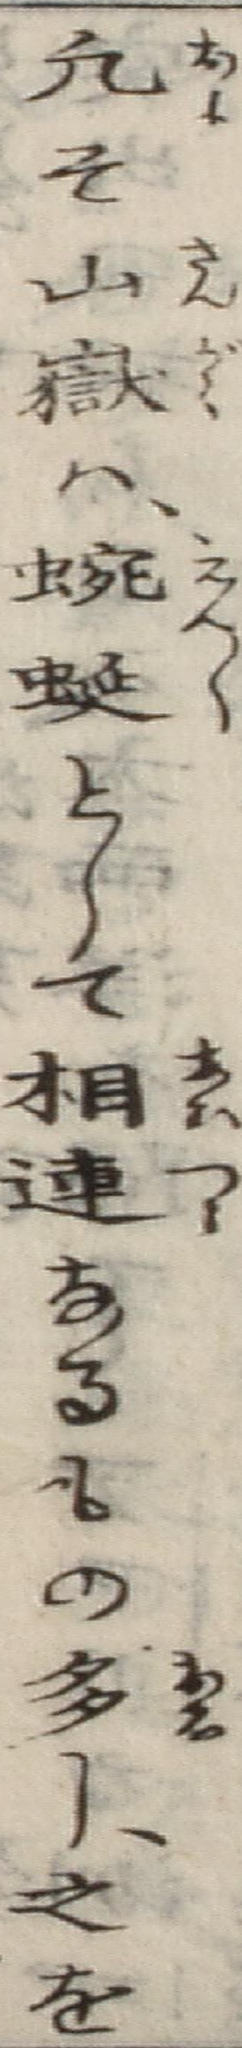凡そ山嶽は、蜿蜓として相連なるもの多し、之を
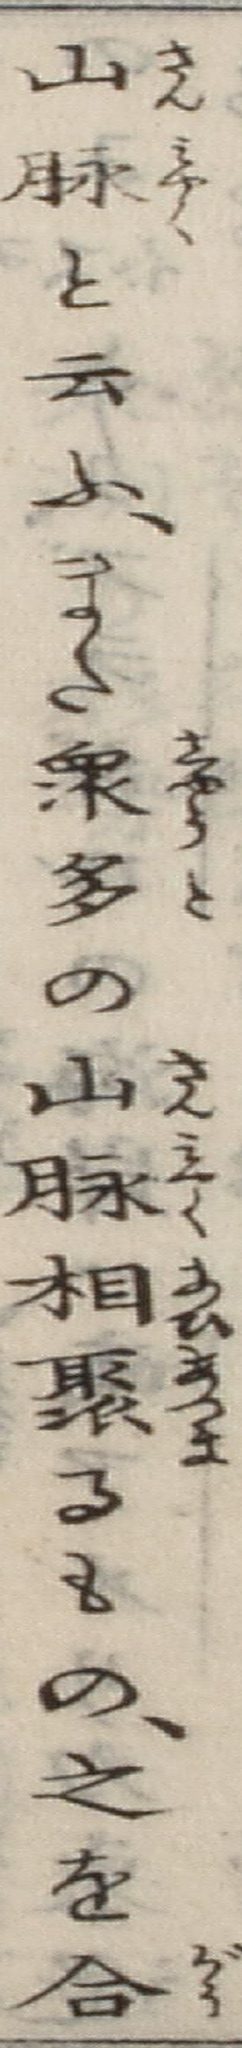山脈と云ふ、また衆多の山脈相聚るもの、之を合
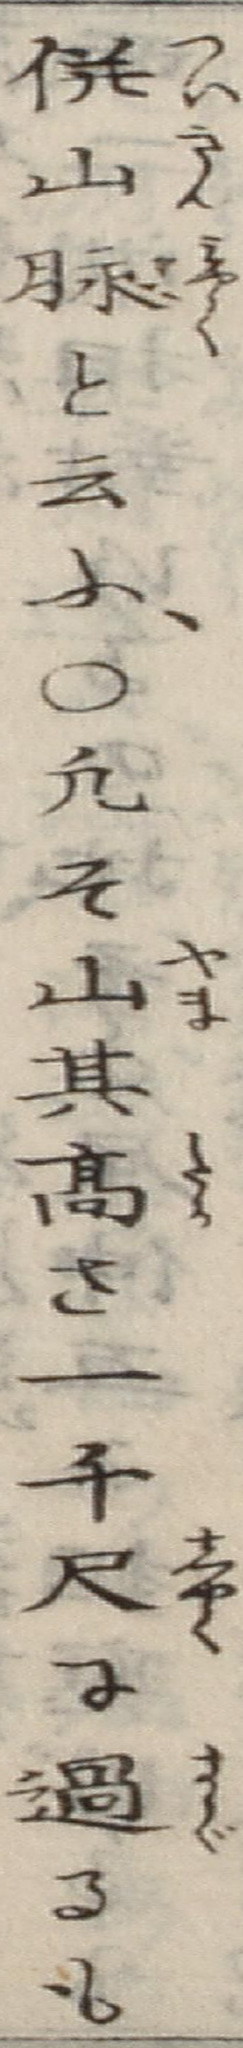併山脈と云ふ、〇凡そ山其高さ千尺に過るも
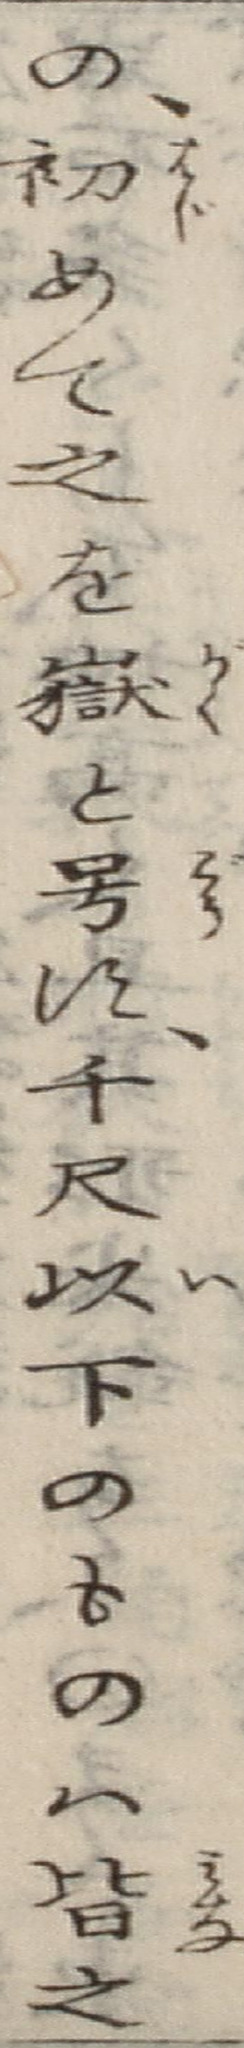の、初めて之を嶽と号す、千尺以下のものは皆之
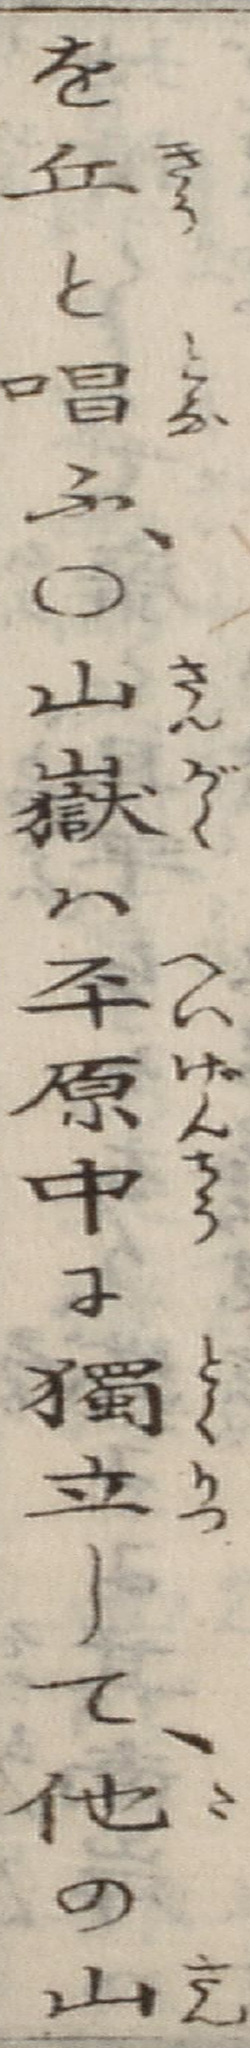を丘と唱ふ、〇山嶽は平原中に独立して、他の山
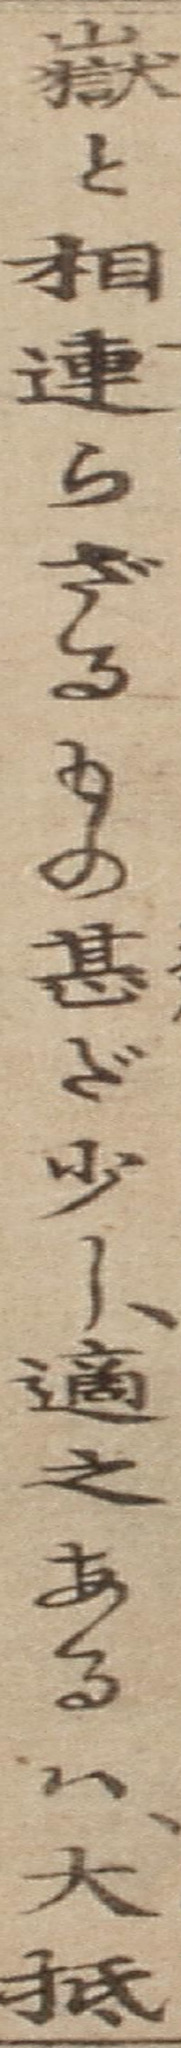嶽と相連らざるもの甚だ少し、適之あるは、大抵
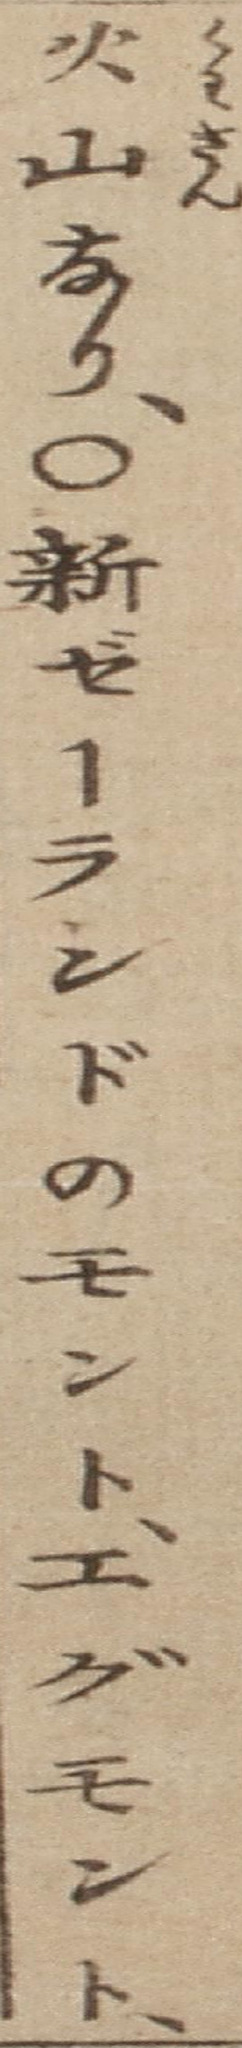火山なり、○新ゼーランドのモント、エグモント、
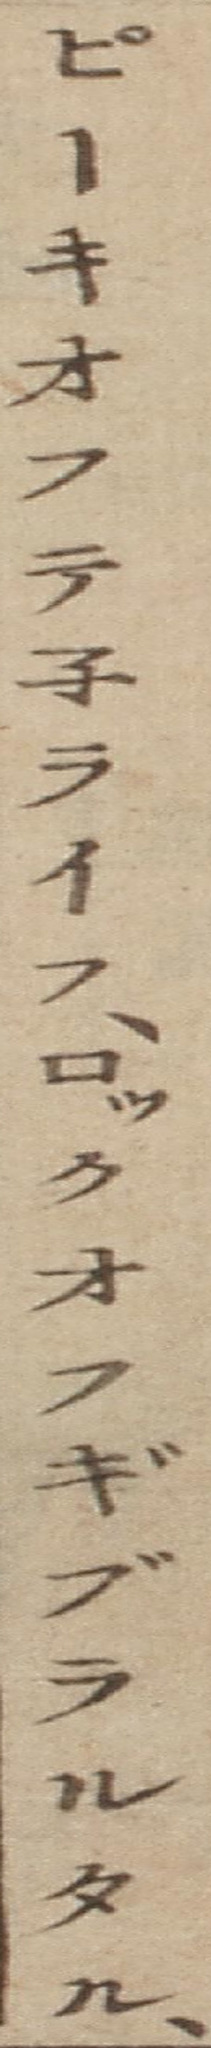ピーキオフテネライフ、ロックオフギブラルタル、
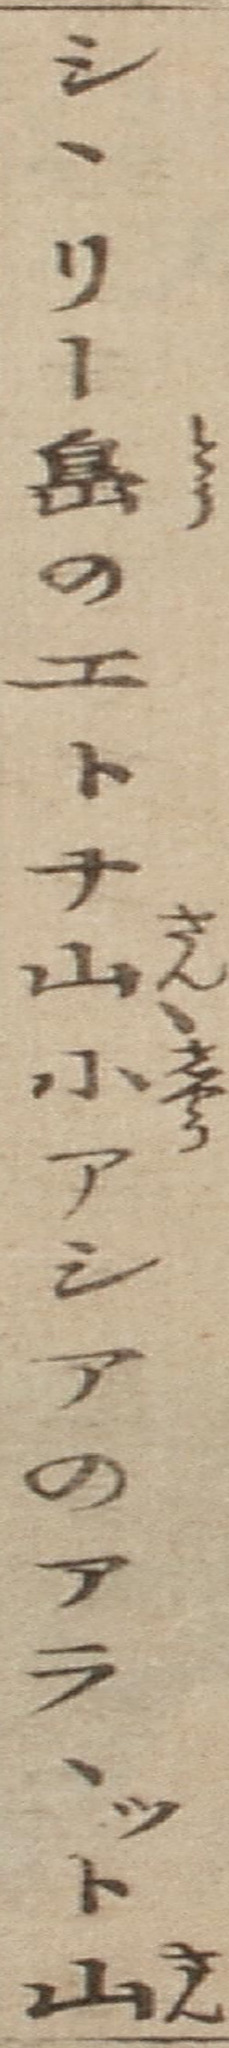シヽリー島のエトナ山、小アシアのアラヽット山
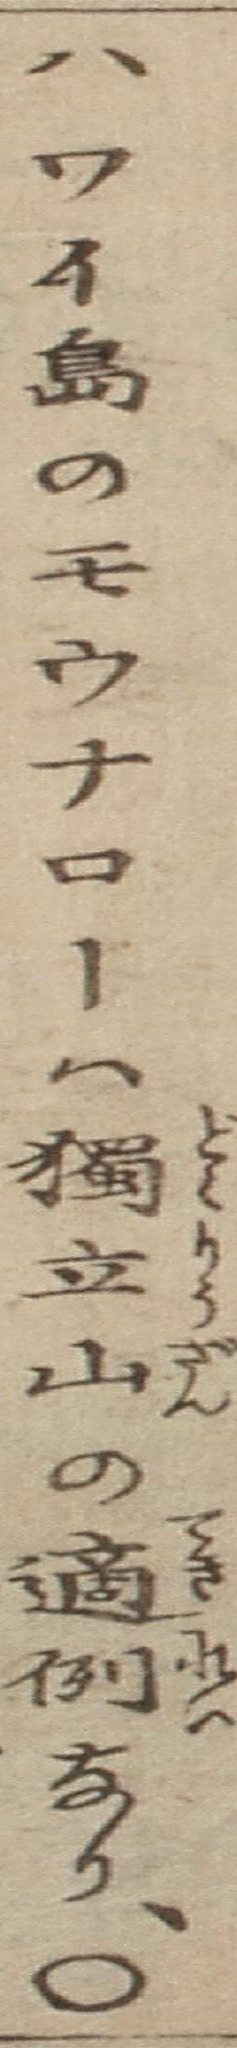ハワイ島のモウナローは独立山の適例なり、○
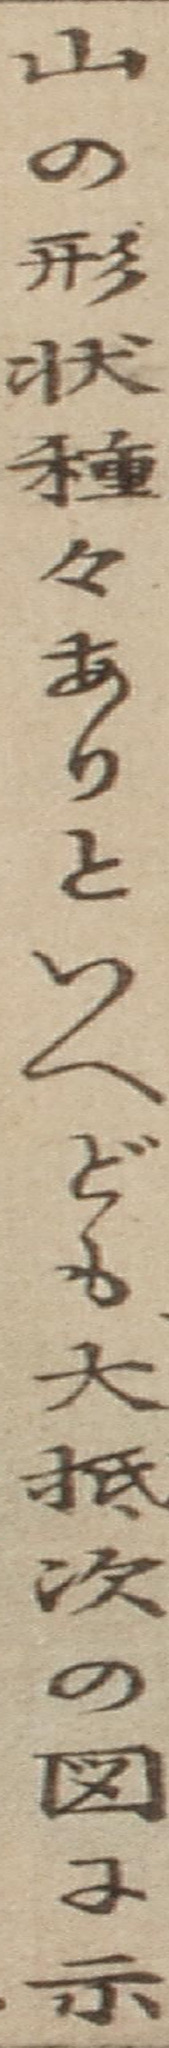山の形状種々ありといへども、大抵次の図に示
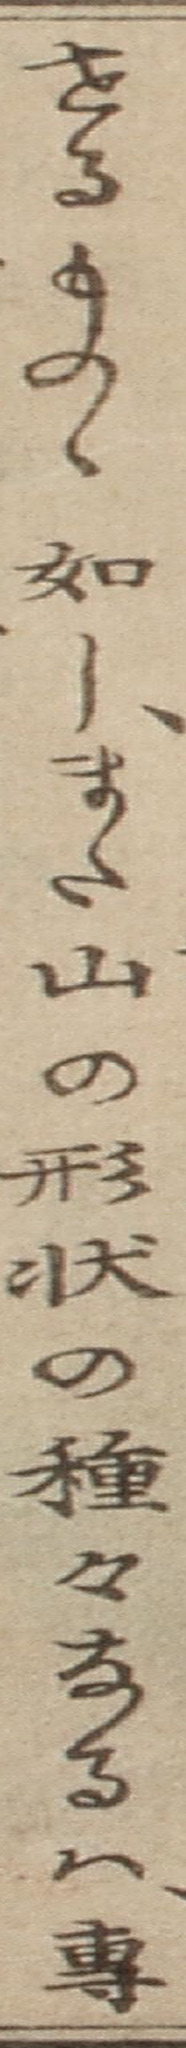せるものゝ如し、また山の形状の種々なるは、専
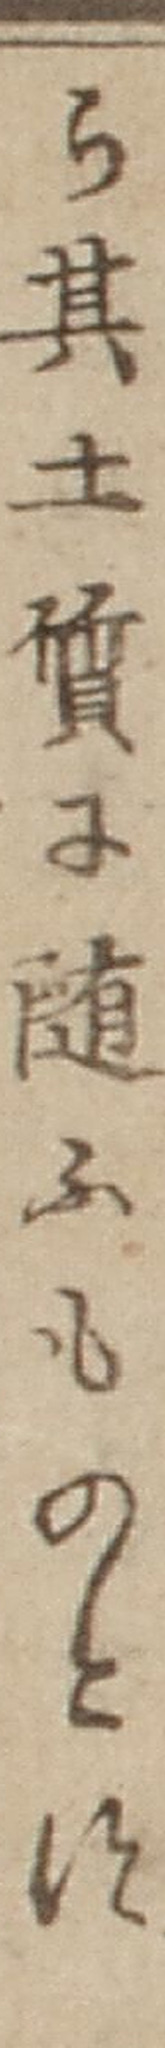ら其土質に随ふものとす、
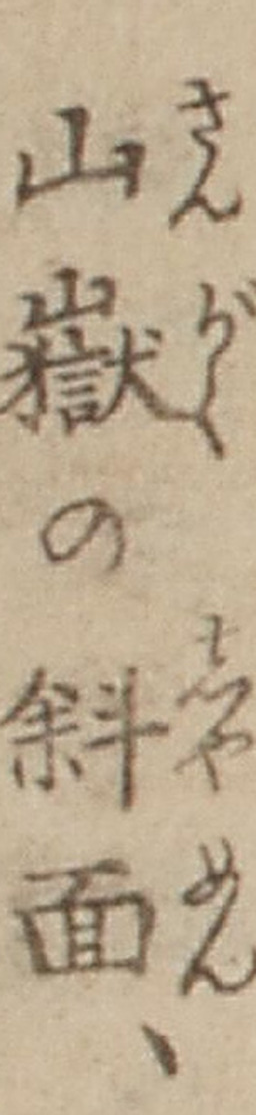山嶽の斜面、

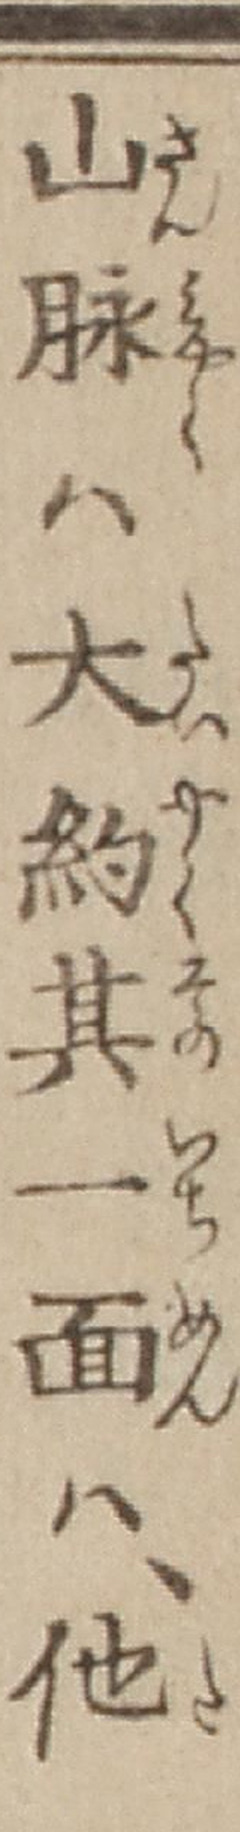山脈は大約其一面は、他
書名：訓蒙　天然地理學　上
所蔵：東京大学地震研究所図書室 Earthquake Research Institute Library, The University of Tokyo, JAPAN
